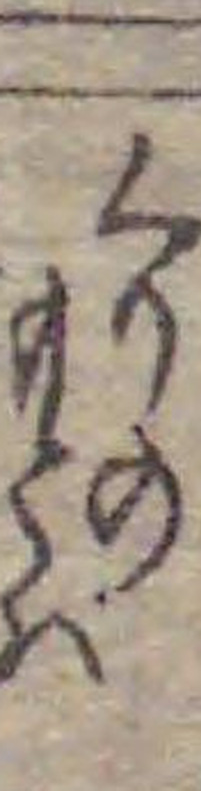くりの
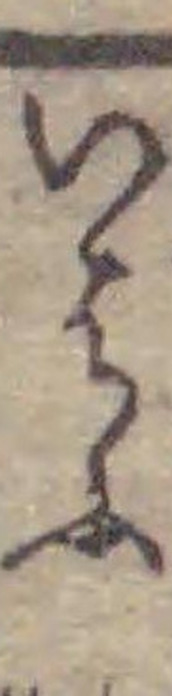いはふ
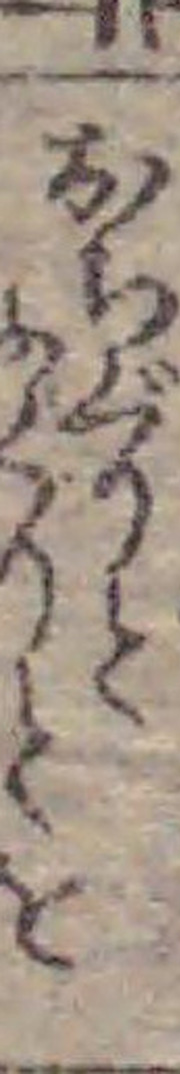おちぐりと
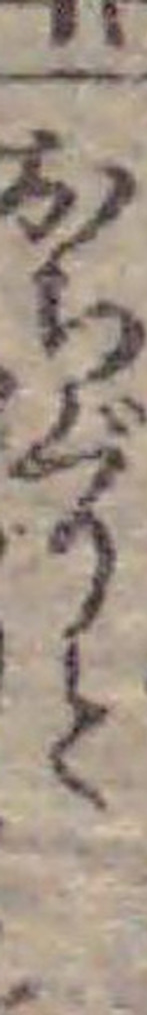おちぐりと
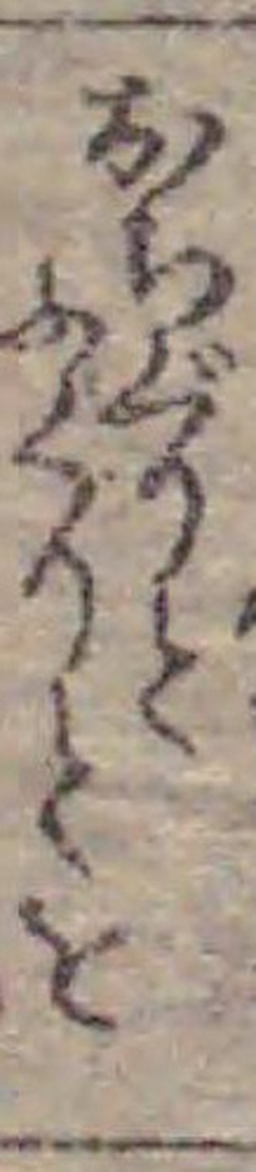ふぐりとを
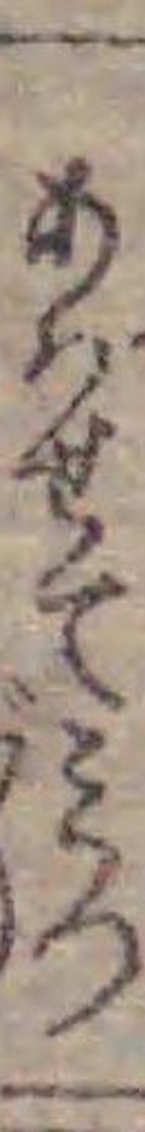あはせてみつ

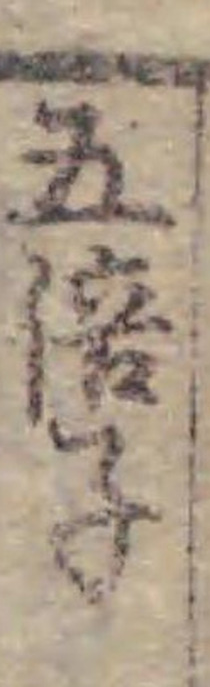五倍子
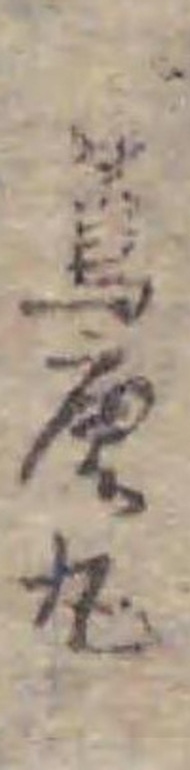蔦唐丸
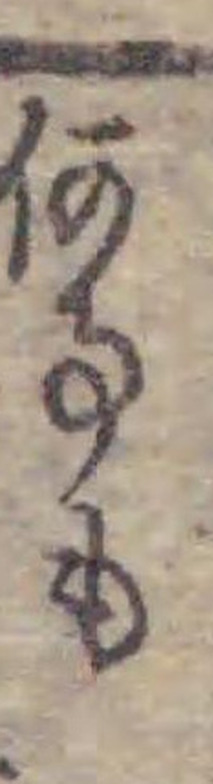何事も
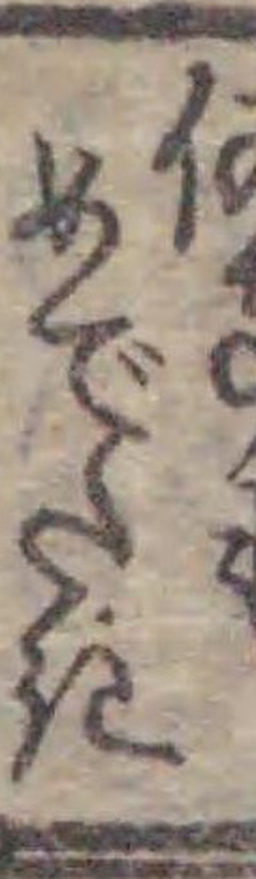めでたき
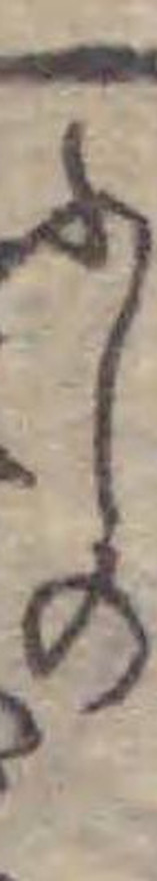ふしの
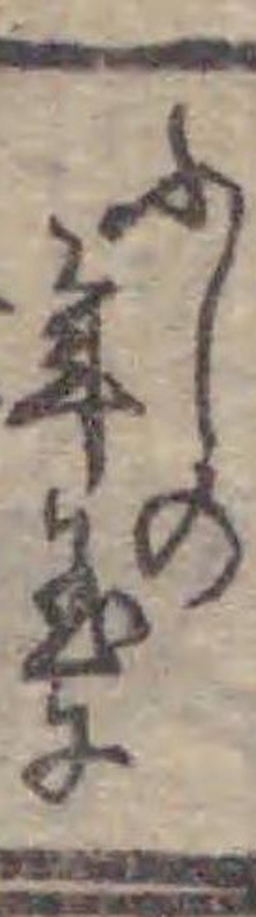年玉に
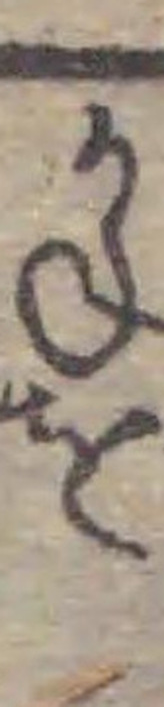かねを
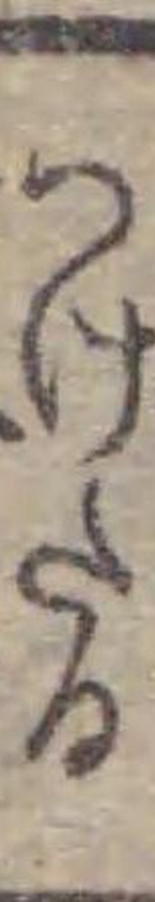つけたる
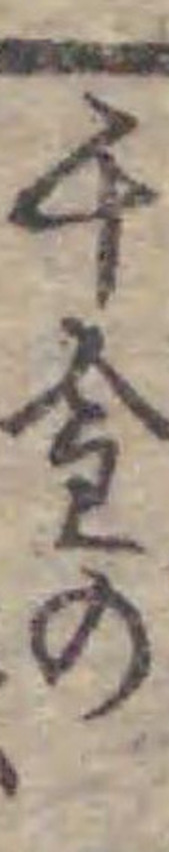千金の
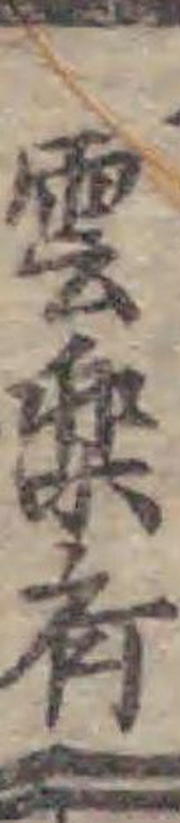雲楽斉
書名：年始御礼帳 : 3巻
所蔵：国立国会図書館 National Diet Library, JAPAN
